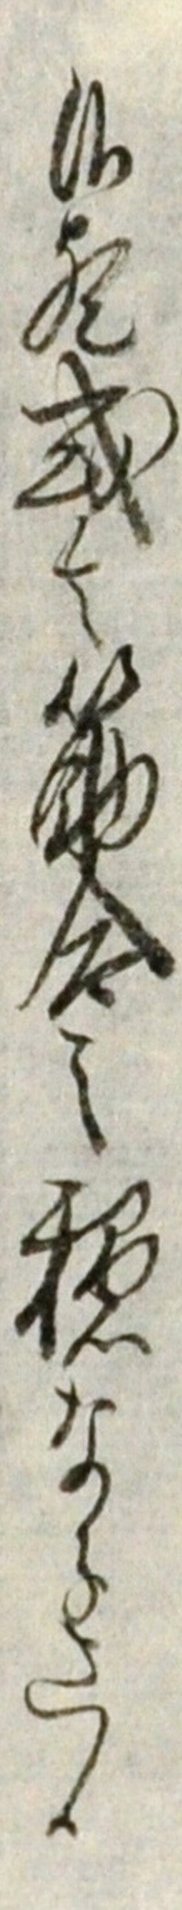候歟或者筋合之穏ならさる
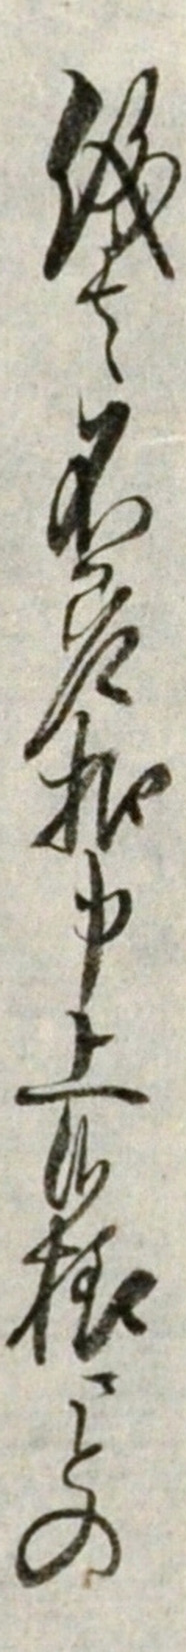儀者不差扣申上候様ニとの
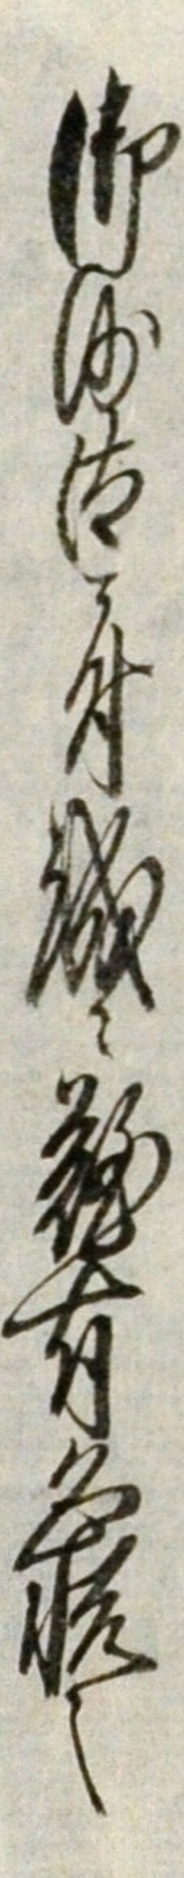御沙汰ニ付誠ニ難有心悦之
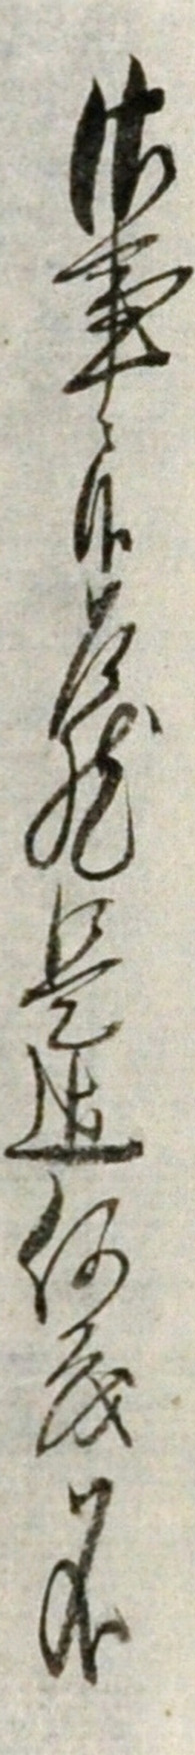御事ニ候乍然是迄何茂被成
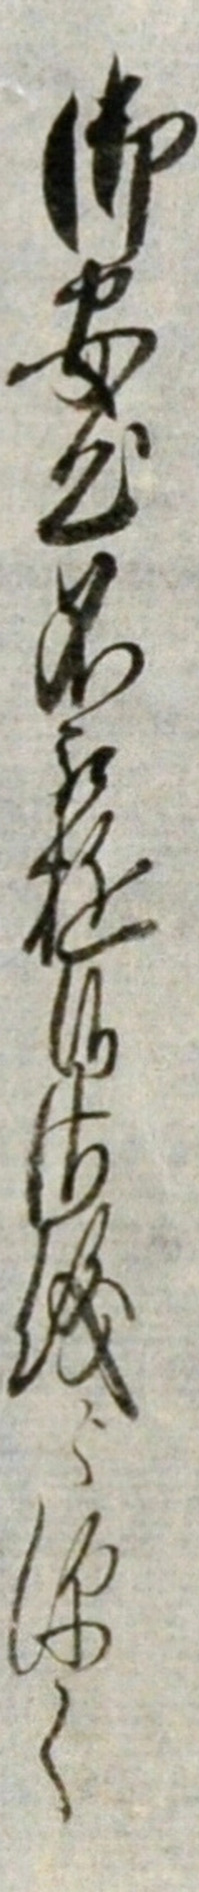御安心不被遊候御儀ゟ深く
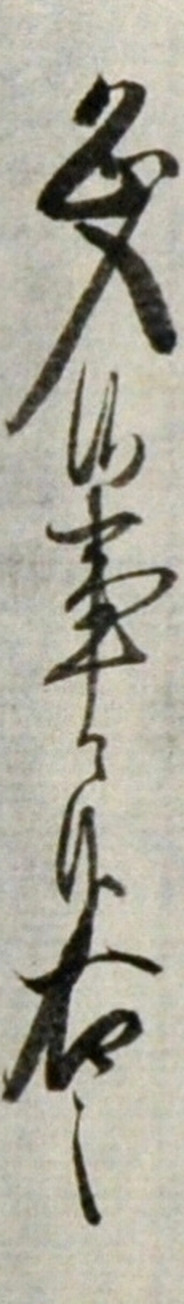心入候事ニ候右之

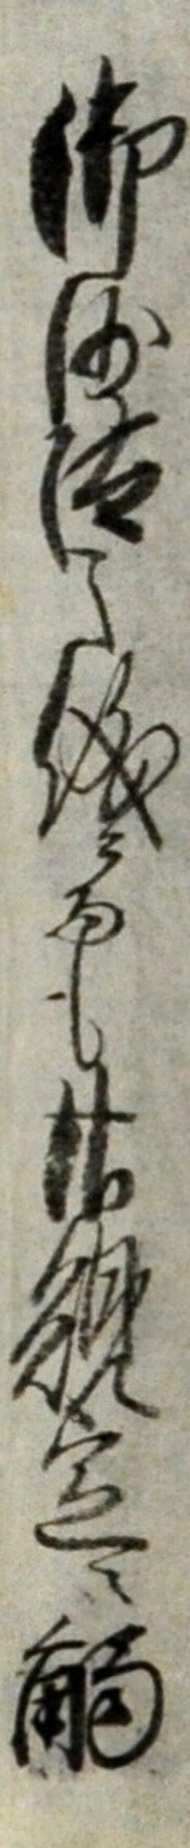御沙汰之儀ニ而も御規定ニ触
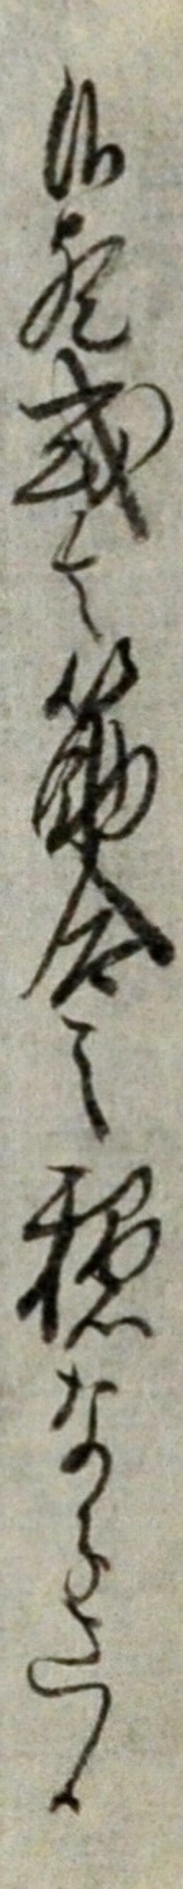候歟或者筋合之穏ならさる
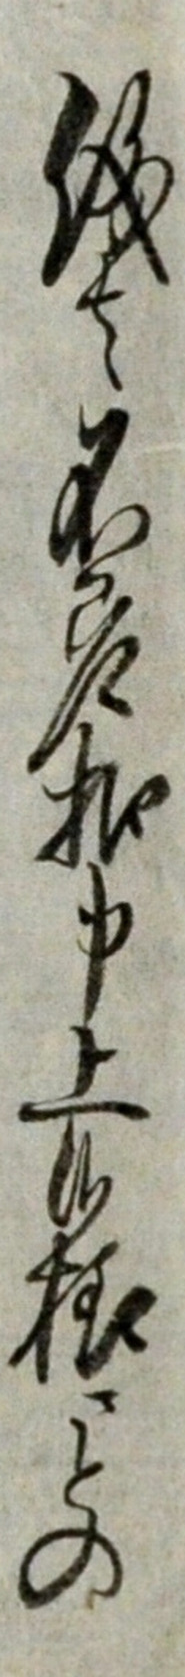儀者不差扣申上候様ニとの
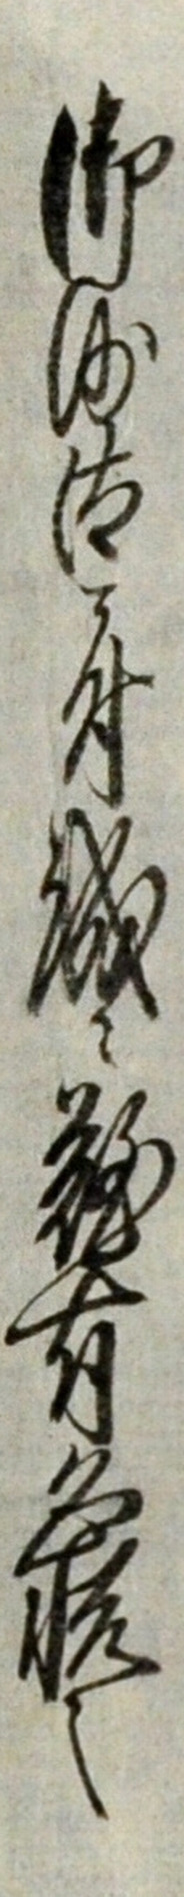御沙汰ニ付誠ニ難有心悦之
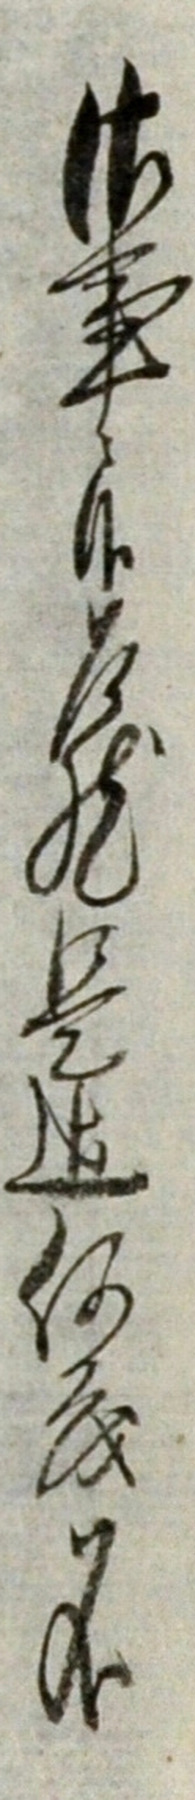御事ニ候乍然是迄何茂被成
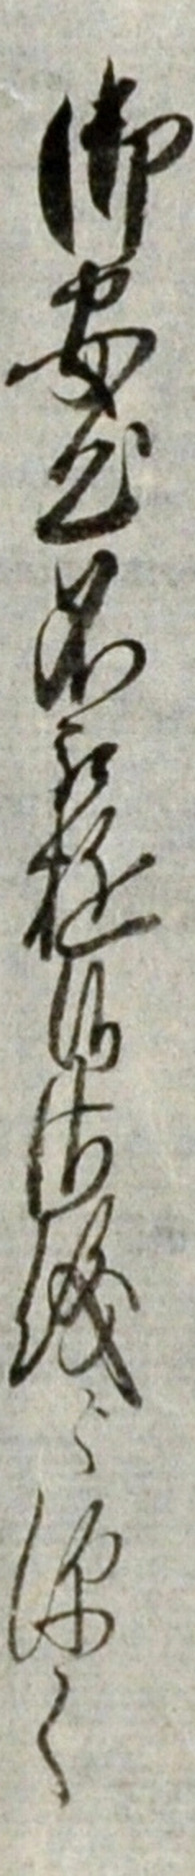御安心不被遊候御儀ゟ深く
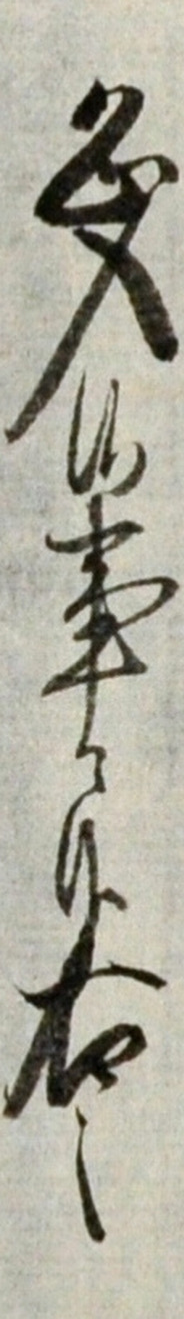心入候事ニ候右之
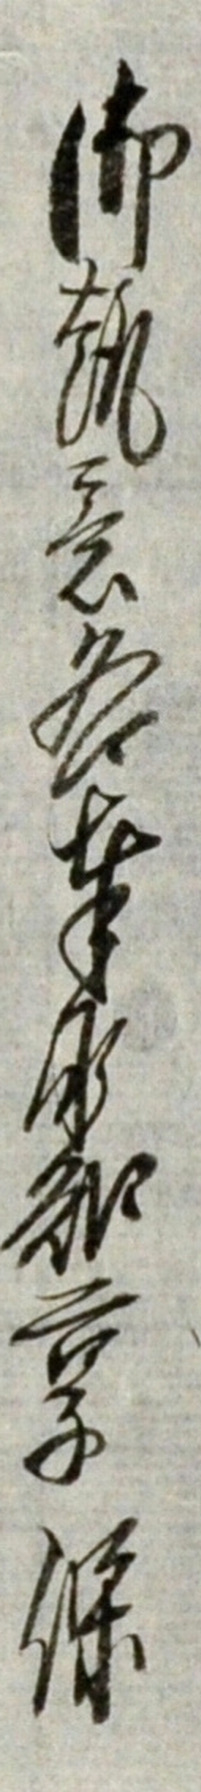御趣意各奉承知享保
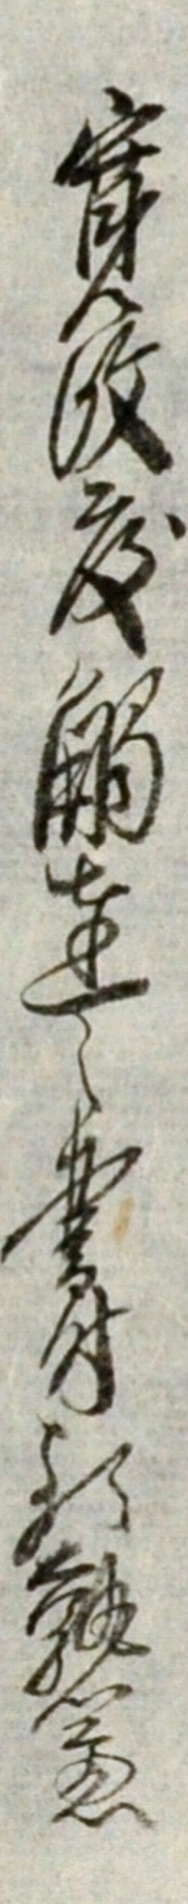寛政度触達之書付類熟慮
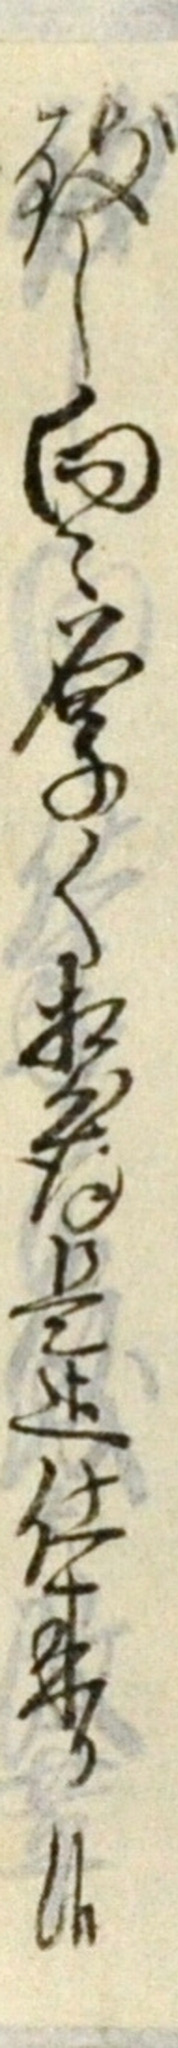致し向々厚く相心得是迄仕来候
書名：若年寄御役中御調書付
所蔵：伊那市立高遠町図書館・合同会社AMANE
